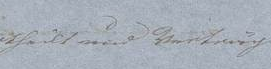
waren schon Konzessionen
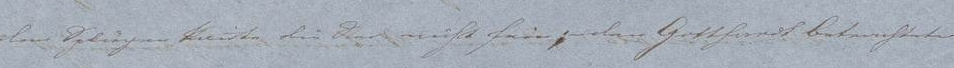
den Splügen konnte die Rede nicht sein; den Gotthardt betrachtete
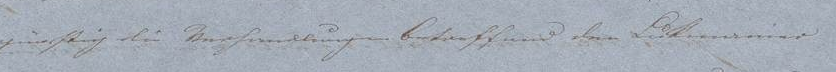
So ungünstig die Verhandlungen betreffend den Lukmanier
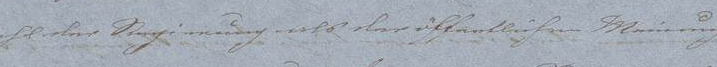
sowohl der Regierung als der öffentlichen Meinung
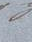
gegen-
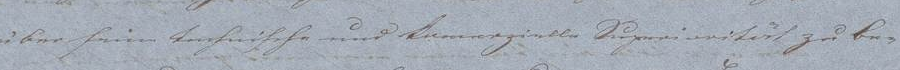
über seine technische und komerzielle Superiorität zu be-
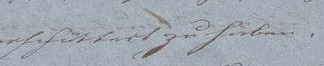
erschüttert zu haben.
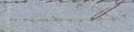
diese Akten
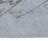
des
